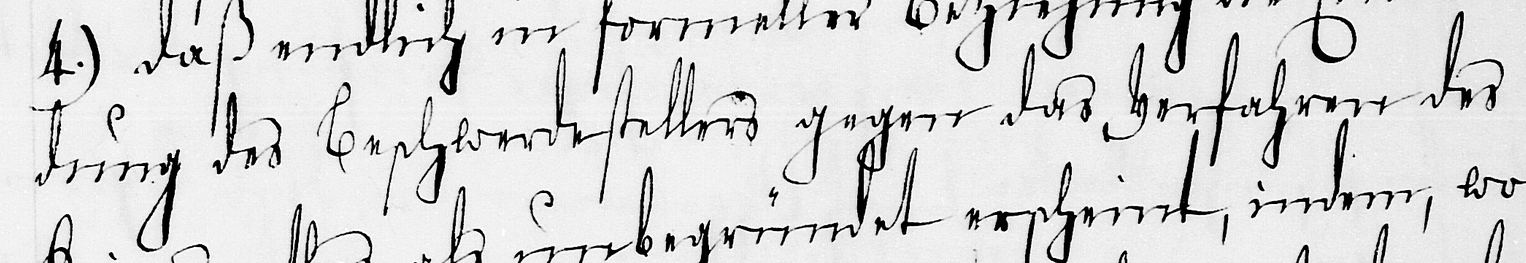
dung des Beschwerdestellers gegen das Verfahren des
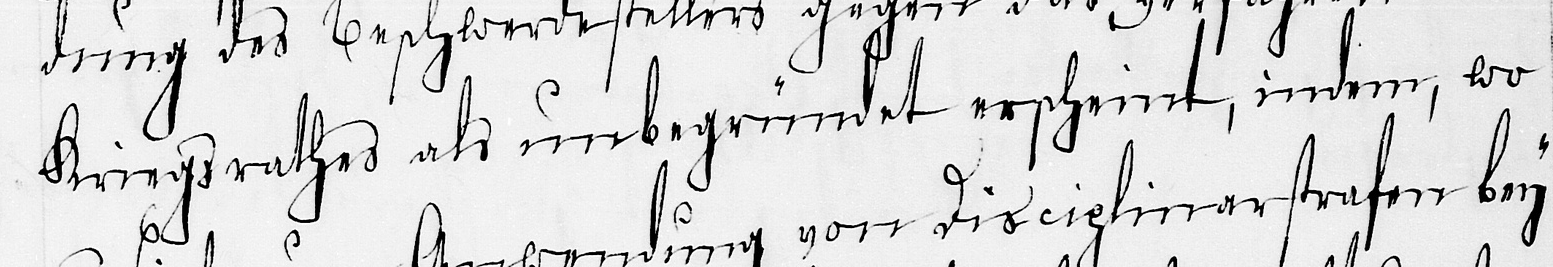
Kriegsrathes als unbegründet erscheint, indem, wo
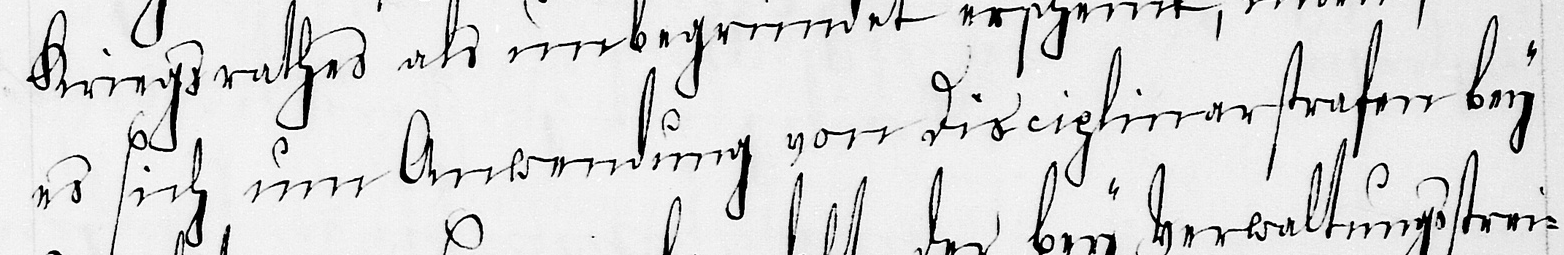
es sich um Anwendung von Disciplinarstrafen bey
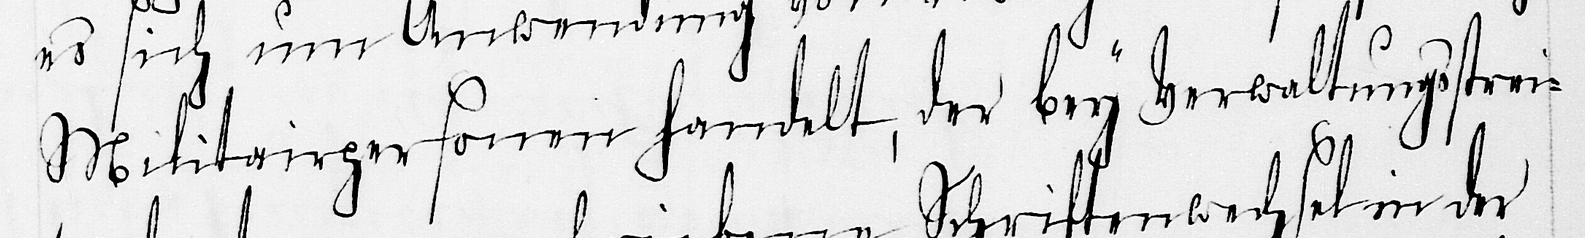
Militairpersonen handelt, der bey Verwaltungsstrei¬
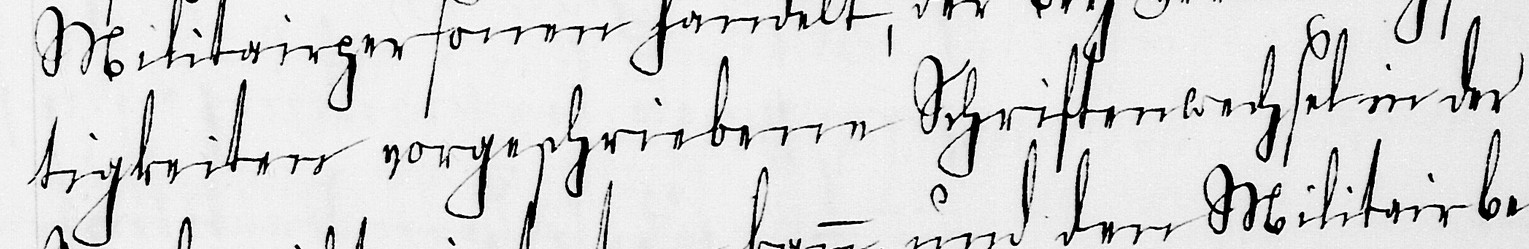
tigkeiten vorgeschriebene Schriftenwechsel in der
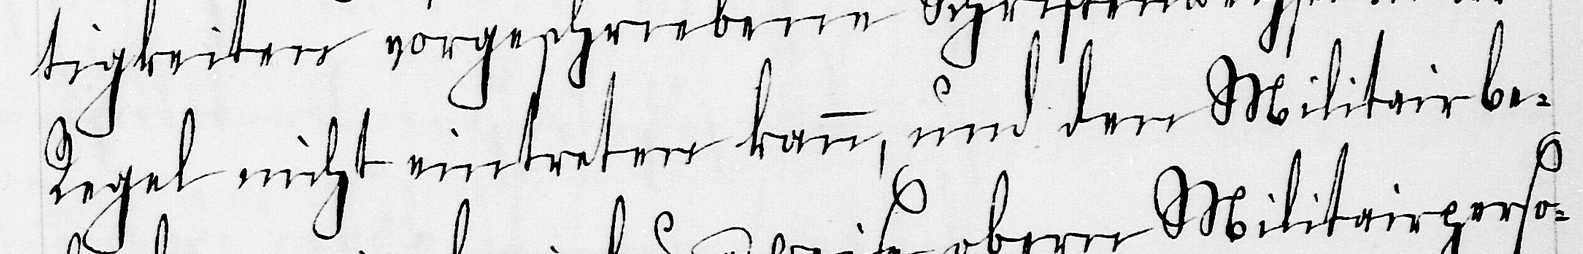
Regel nicht eintreten kann, und den Militairbe¬
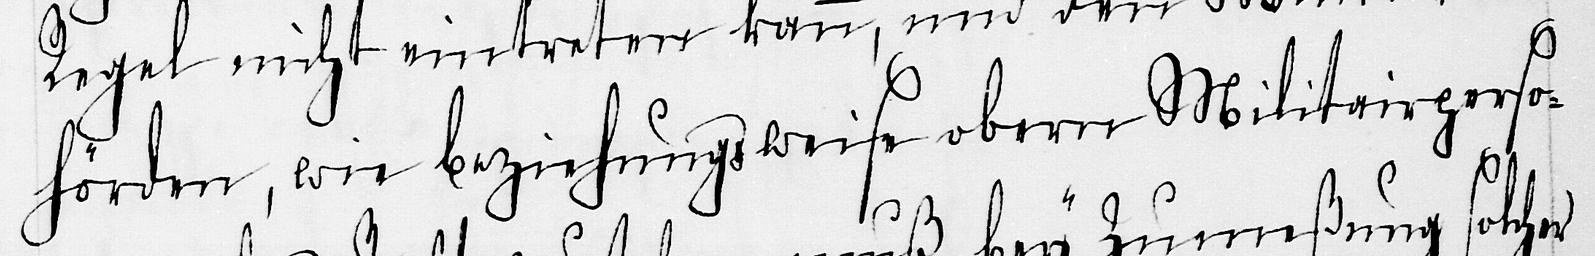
hörden, wie beziehungsweise obern Militairperso¬
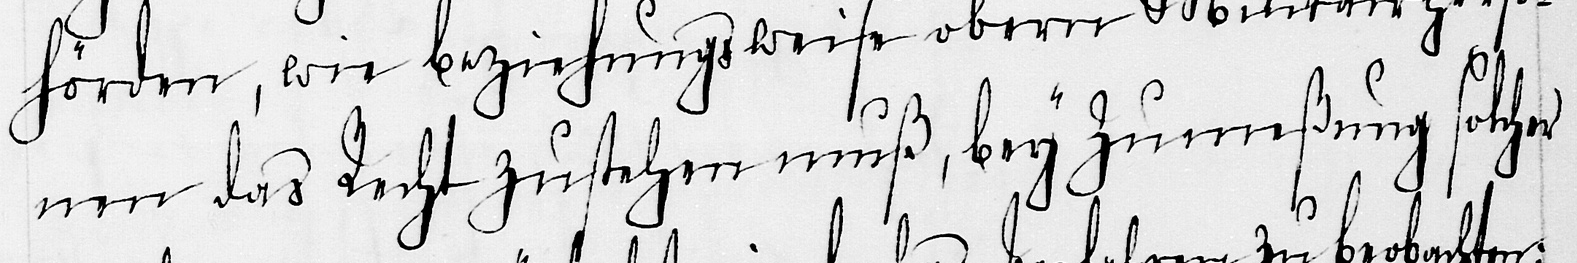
nen das Recht zustehen muß, bey Zumeßung solcher
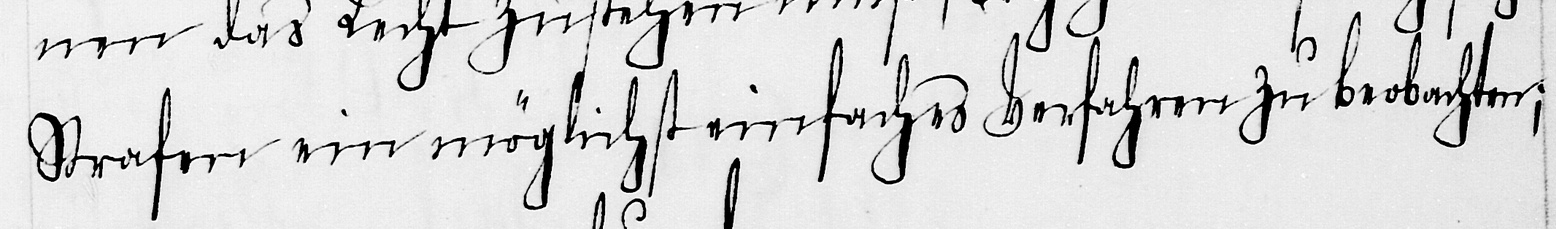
Strafen ein möglichst einfaches Verfahren zu beobachte¬
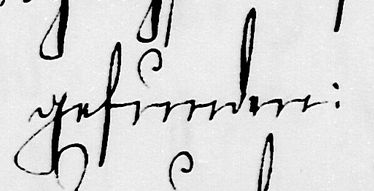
gefunden:
